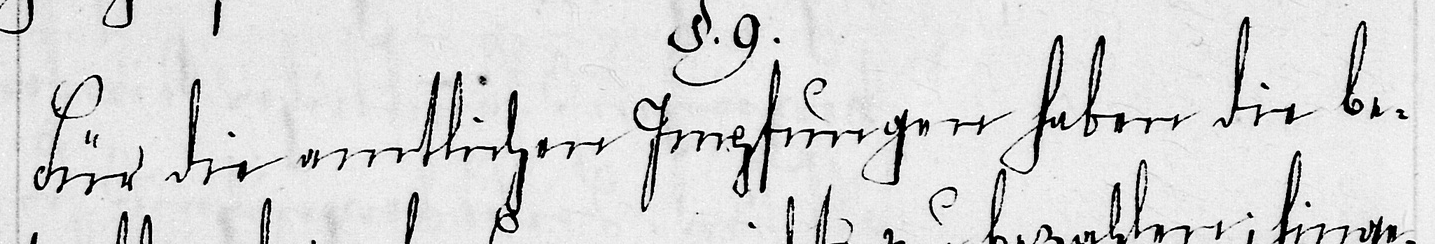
Für die amtlichen Impfungen haben die be¬
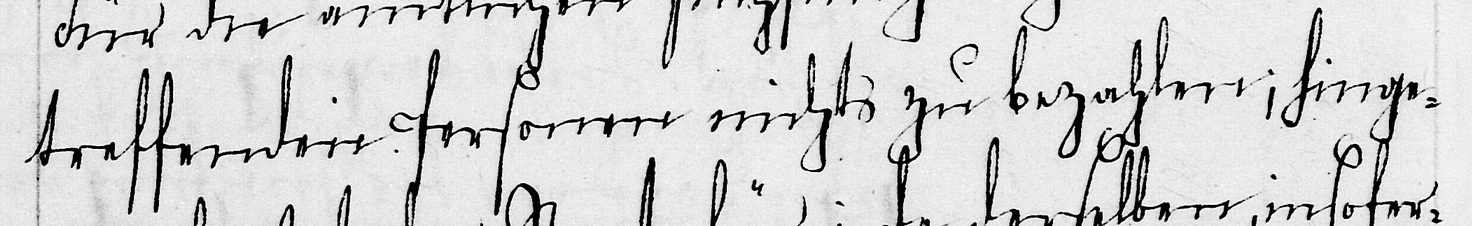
treffenden Personen nichts zu bezahlen; hinge¬
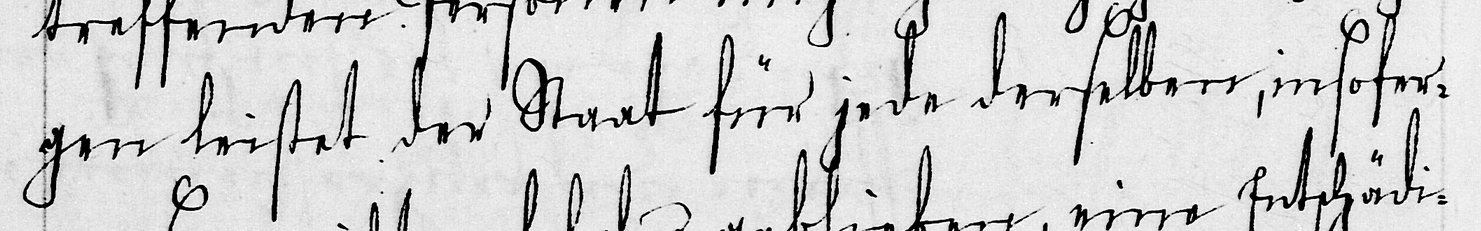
gen leistet der Staat für jede derselben, insofer¬
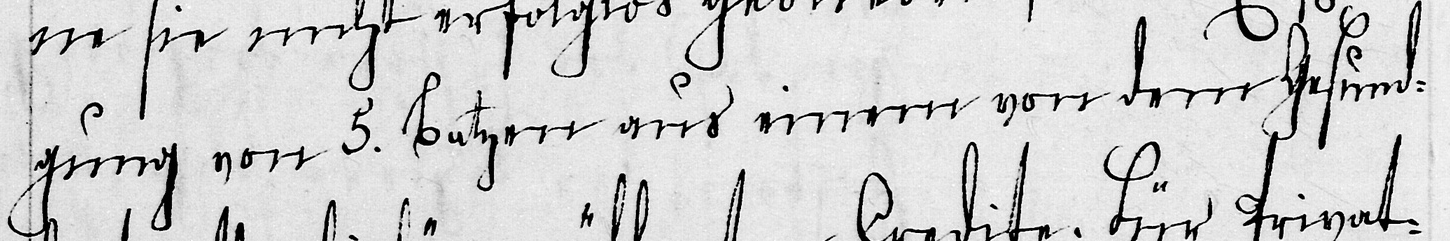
igung von 5. Batzen aus einem von dem Gesund¬
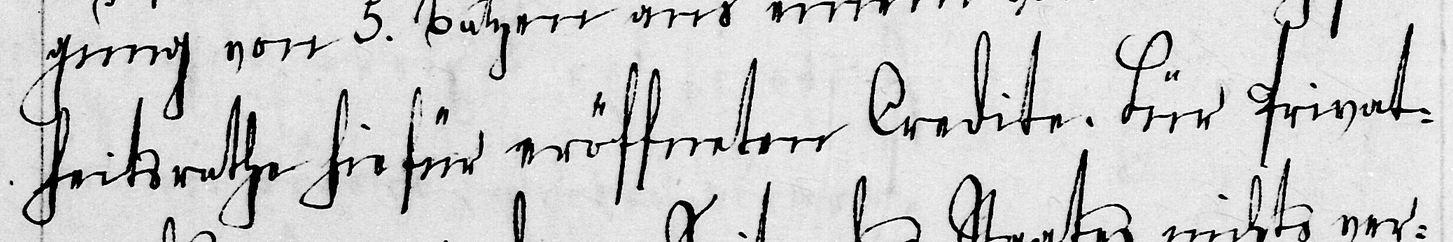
heitsrathe hiefür eröffneten Credite. Für Privat¬
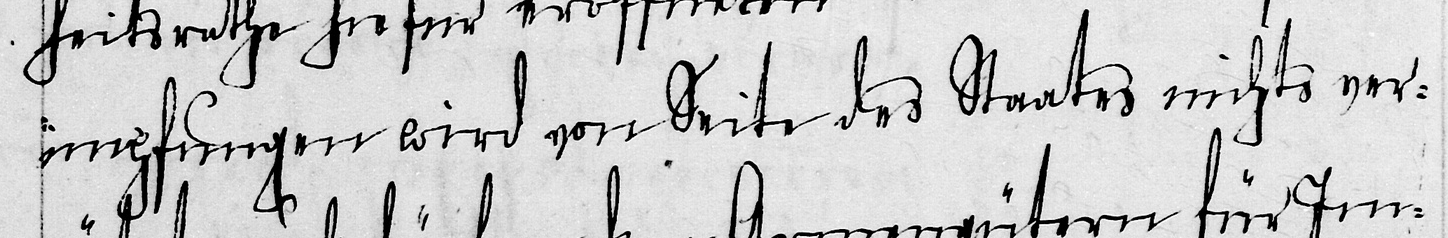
impfungen wird von Seite des Staates nichts ver¬
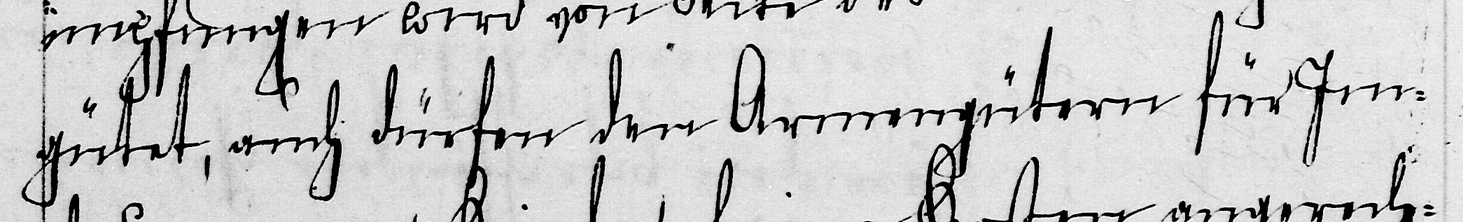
gütet, auch dürfen den Armengütern für Im¬
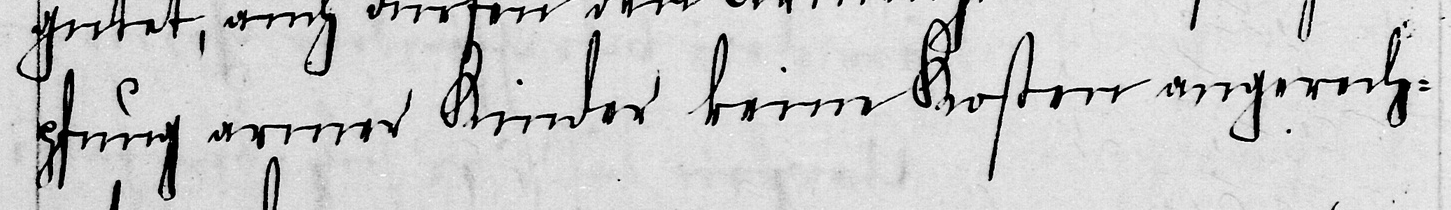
pfung armer Kinder keine Kosten angerech¬
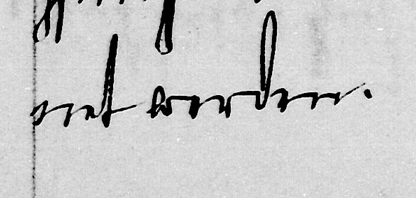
net werden.
